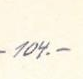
104
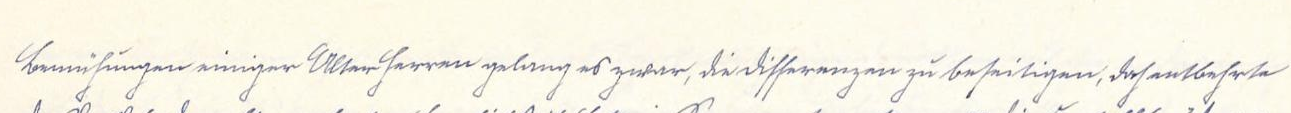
Bemühungen einiger Alter Herren gelang es zwar, die Differenzen zu beseitigen, doch entbehrte
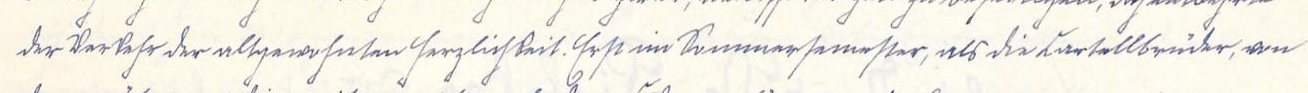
der Verkehr der altgewohnten Herzlichkeit. Erst im Sommersemester, als die Cartellbrüder, von
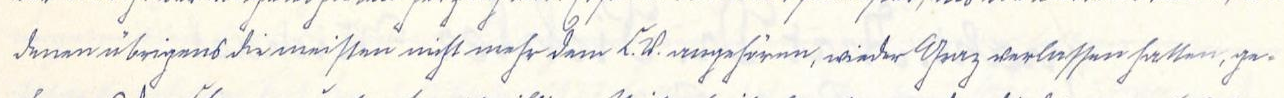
denen übrigens die meisten nicht mehr dem C angehören, wieder Graz verlassen hatten, ge-
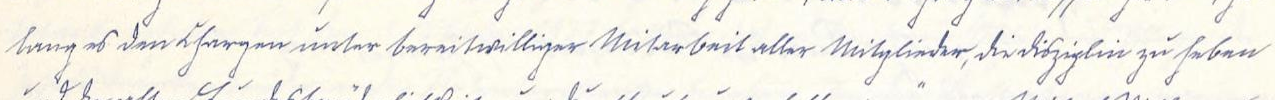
lang es den Chargen unter bereitwilliger Mitarbeit aller Mitglieder, die Disziplin zu heben
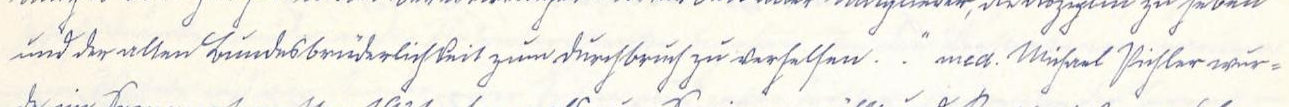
und der alten Bundesbrüderlichkeit zum Durchbruch zu verhelfen." med. Michael Pichler wur-
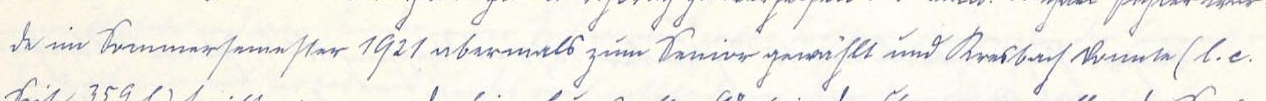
de im Sommersemester 1921 abermals zum Senior gewählt und Kresbach konnte (l. c
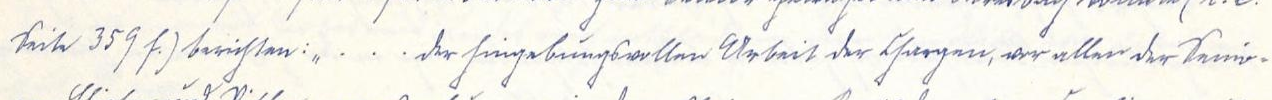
Seite 359 f.) berichten: "Der hingebungsvollen Arbeit der Chargen, vor allem der Senior-
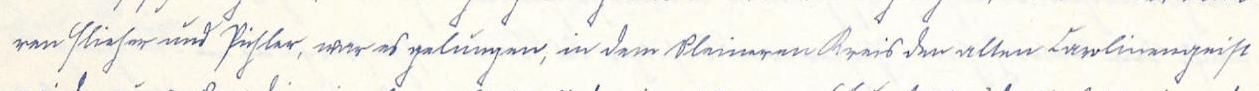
ren Flieher und Pichler, war es gelungen, in dem kleineren Kreis den alten Carolinengeist
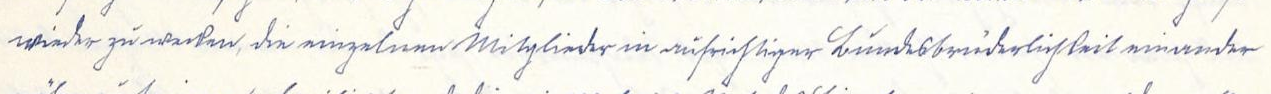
wieder zu wecken, die einzelnen Mitglieder in aufrichtiger Bundesbrüderlichkeit einander
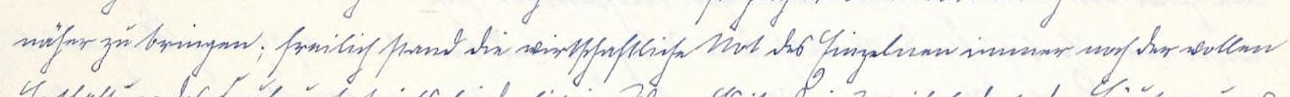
nähern zu bringen; freilich stand die wirtschaftliche Not des Einzelnen immer noch der vollen
